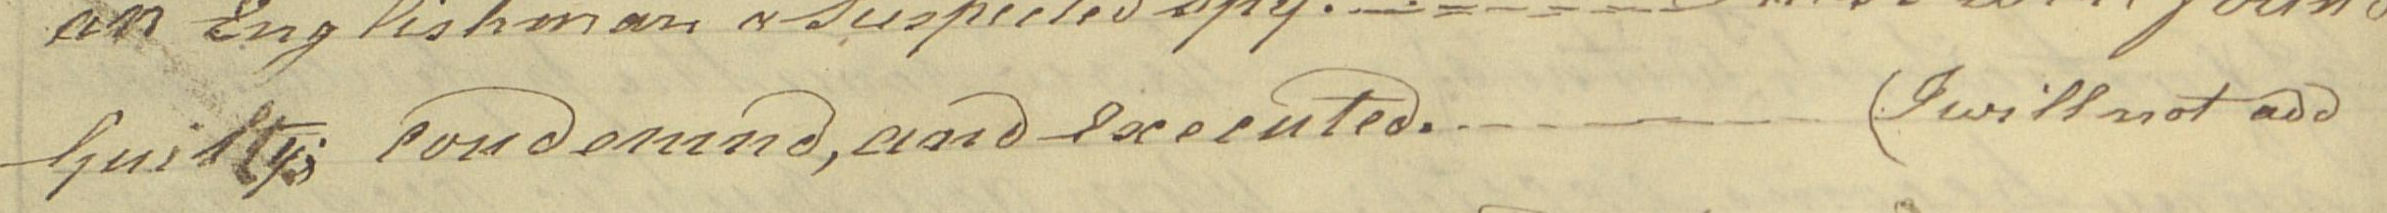Guilty condemnd, and Executed. (I will not add
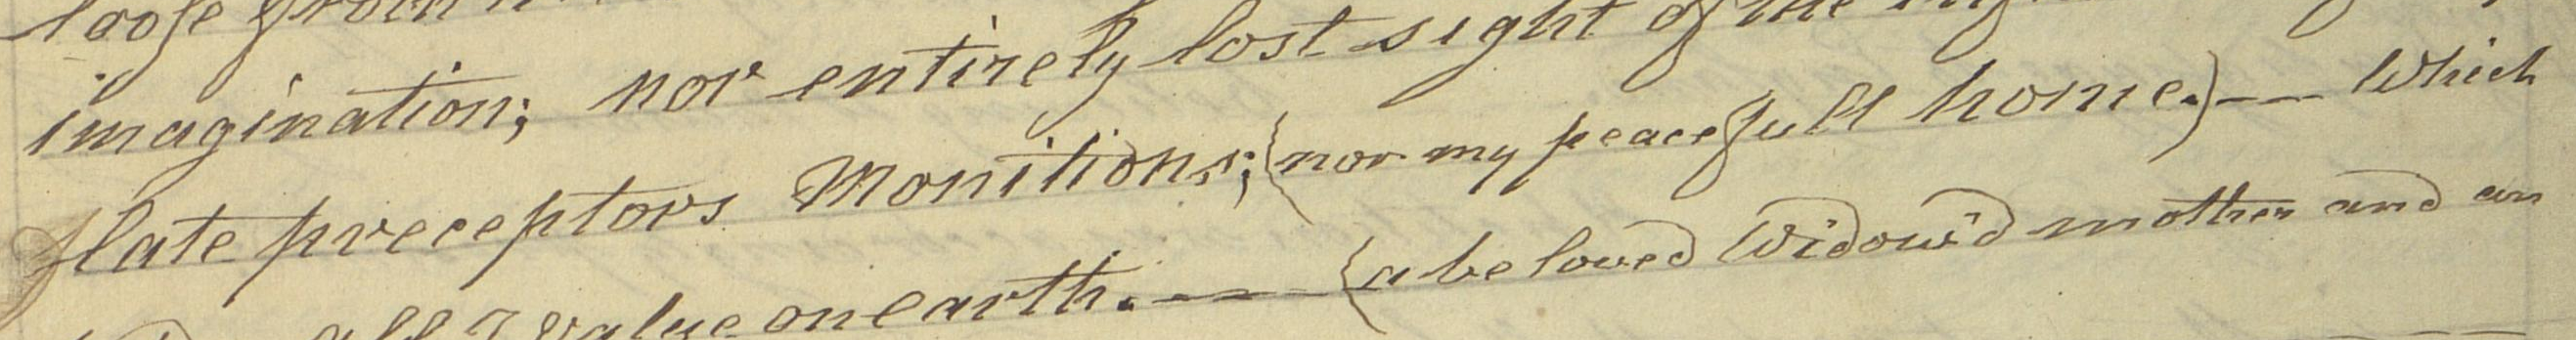late preceptors Moitions; (nor my peacsfell home.) Which
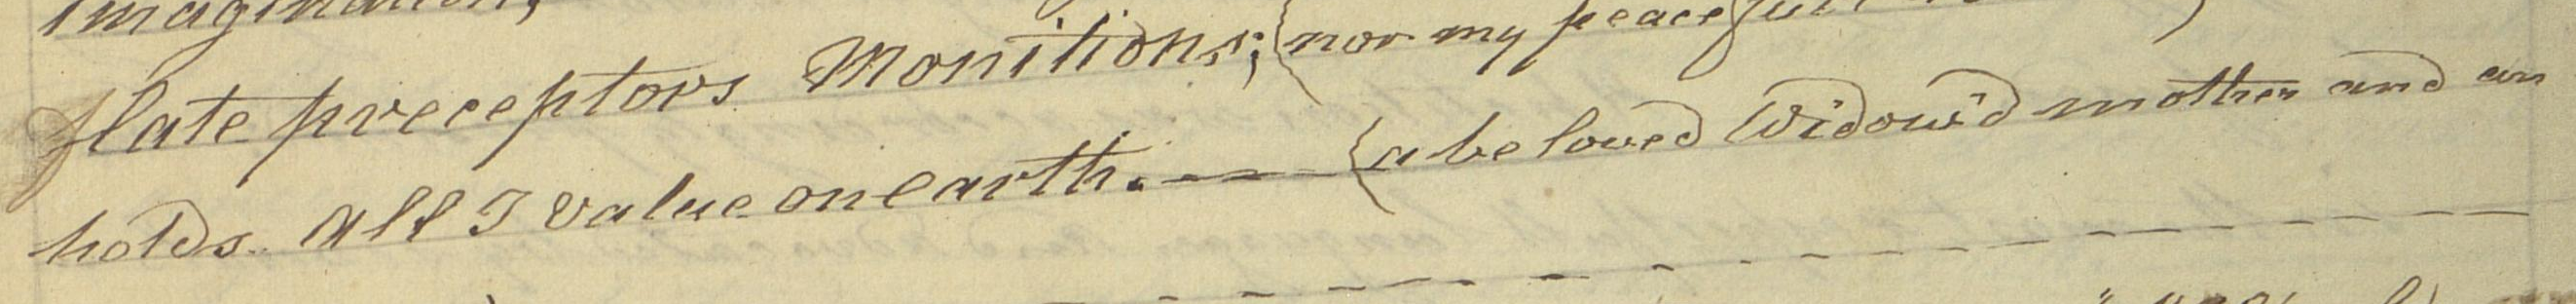holds all I Value on earth (a be loved Widow'd moter and an
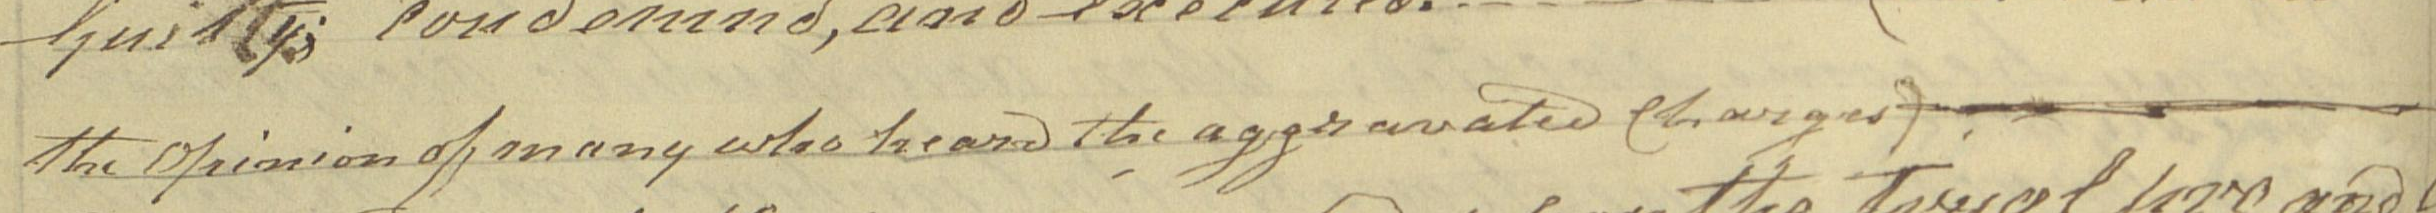the opinion of many who heard the aggravated Charge)
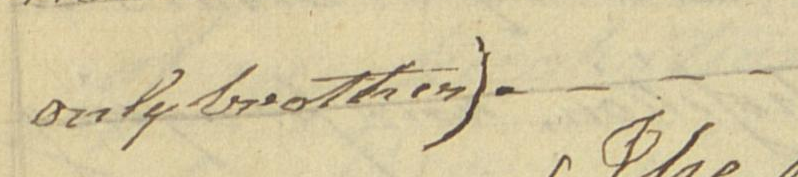only brother)
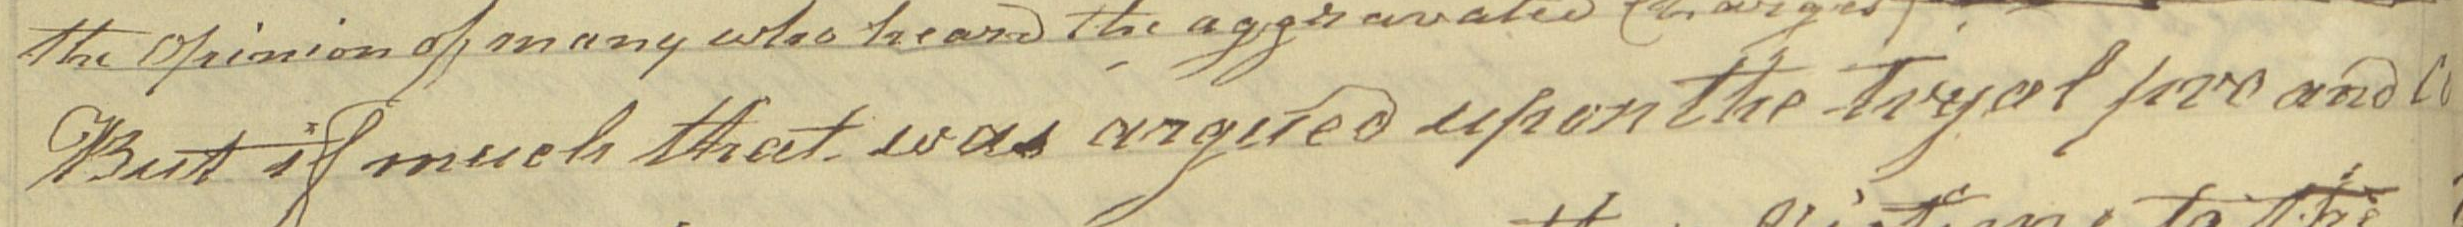But if much that was argued upon the tryal pro and co-
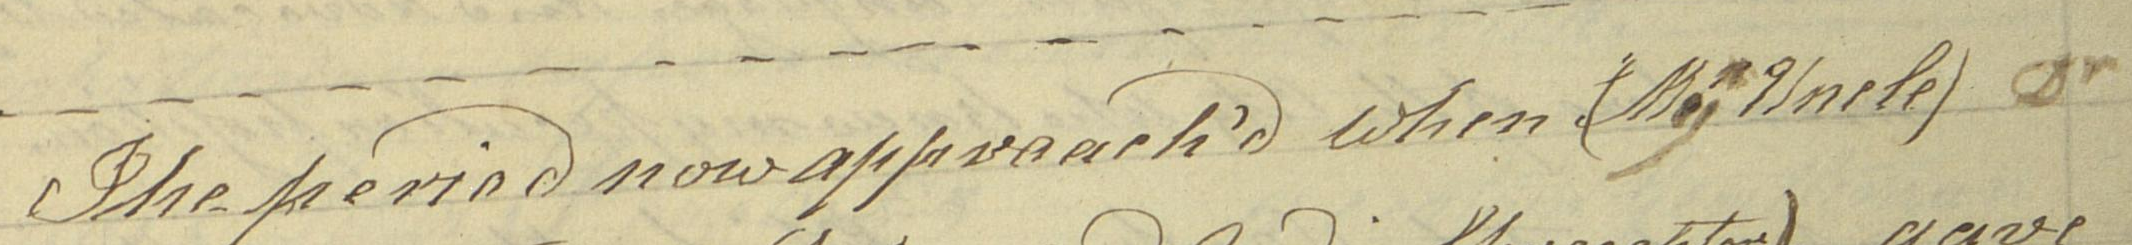The period now approach'd when (My Uncle)
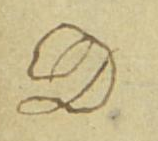D
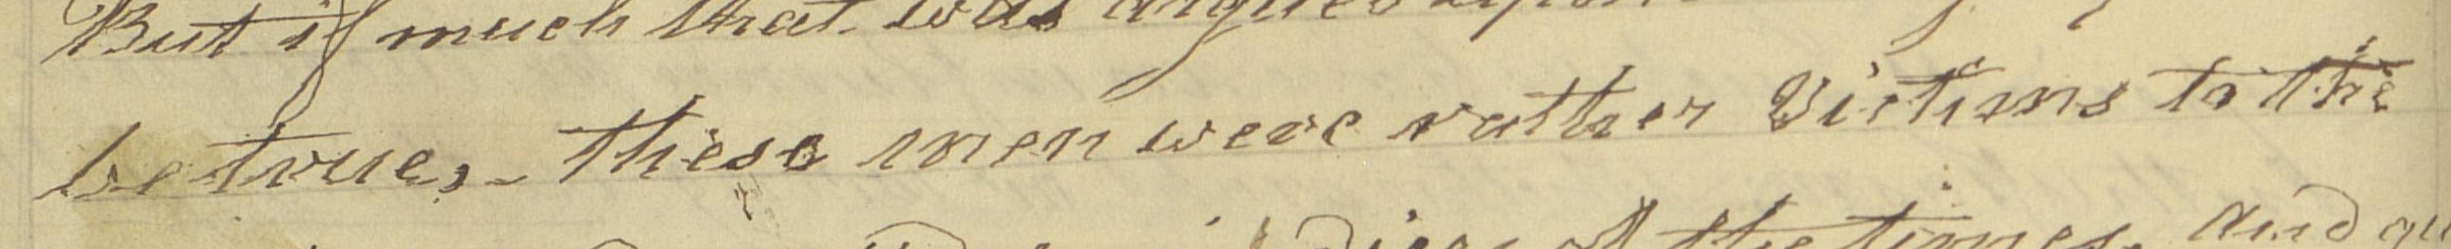be true, these men were rather Victims to the
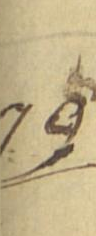-79
